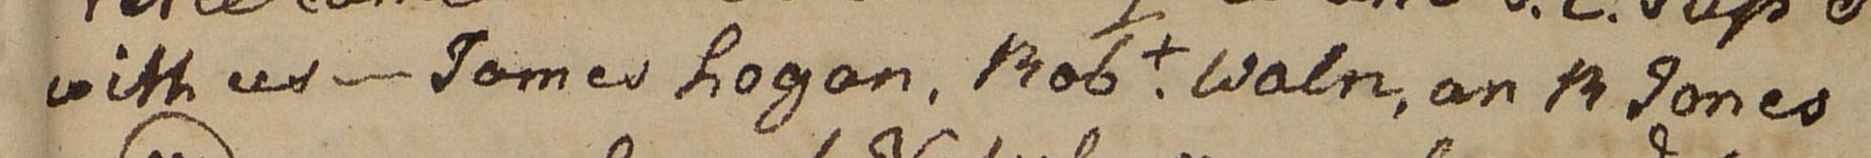with us- James Logan, Rob^t. Waln, an R Jones
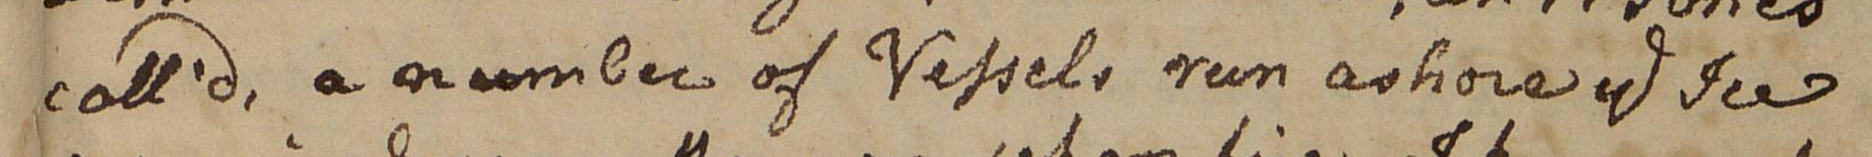call'd, a number of Vessels run ashore y^e see
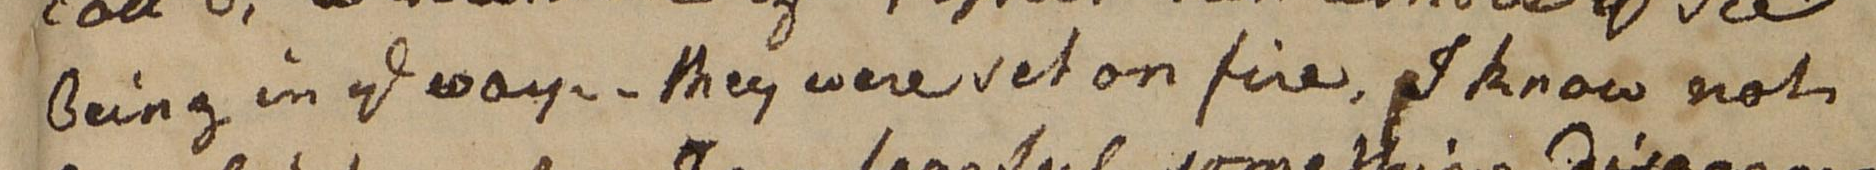being in y^e way- they were set on fire, I know not
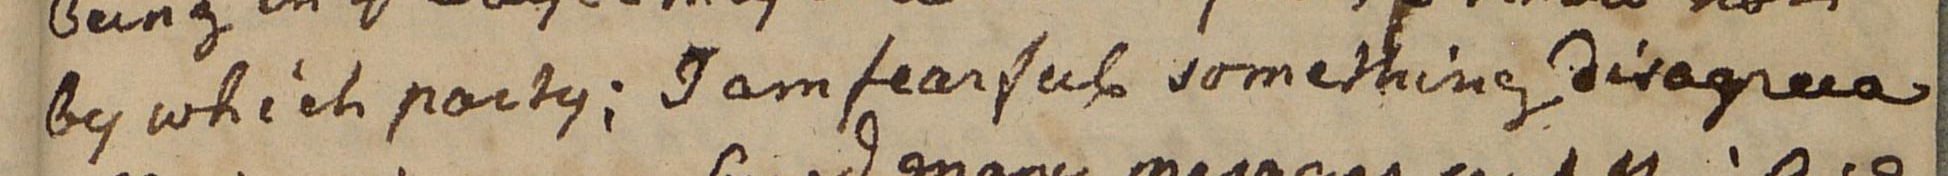by which party; I am fearful something disagreea
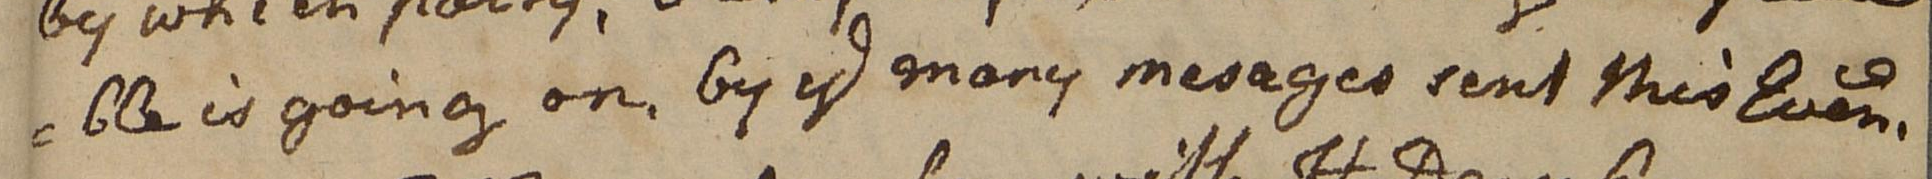-ble is going on. by y^e many mesages sent this Even^g.
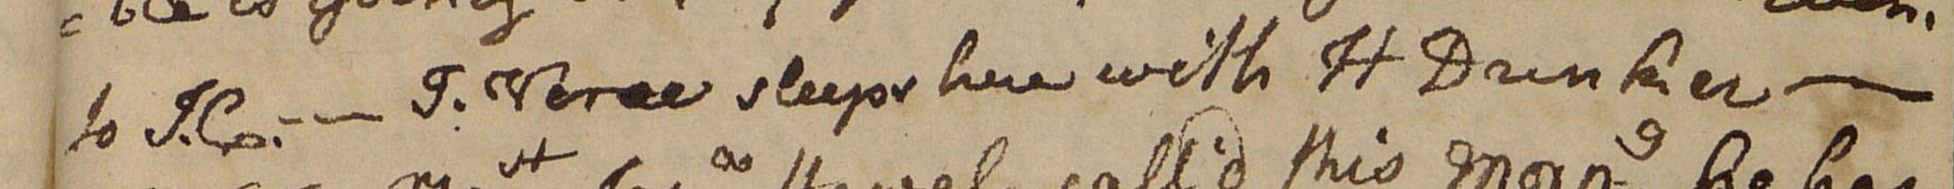to J .C.-- J. Veree sleeps here with H Drinker-
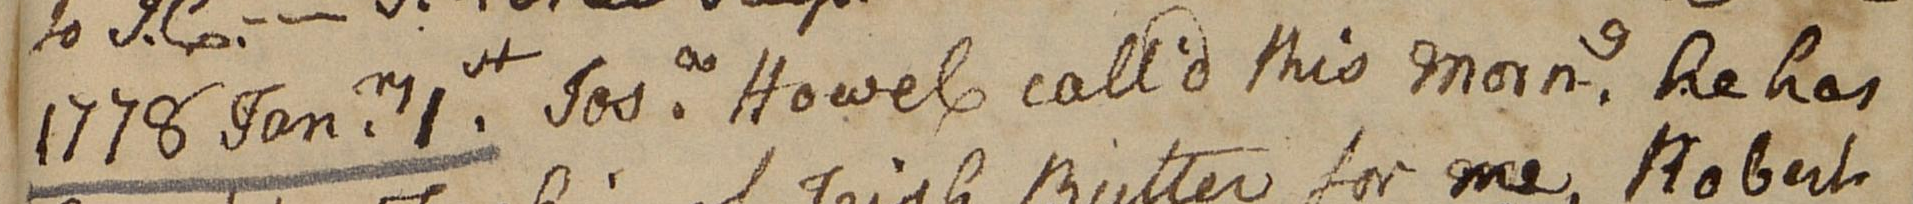1778 Jan^ry. 1^st. Jos^h. Howel call'd this morn^g. he has
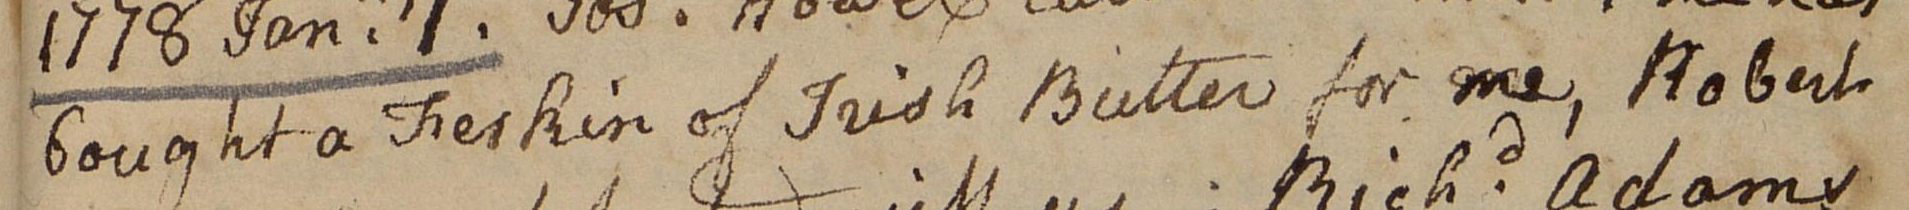bought a Ferkin? of Irish Butter for me, Robert
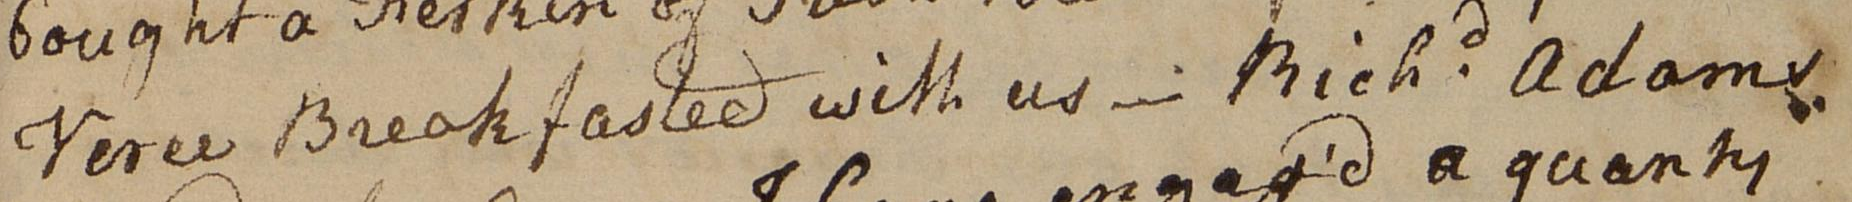Veree Breakfasted with us- Rich^d. Adams
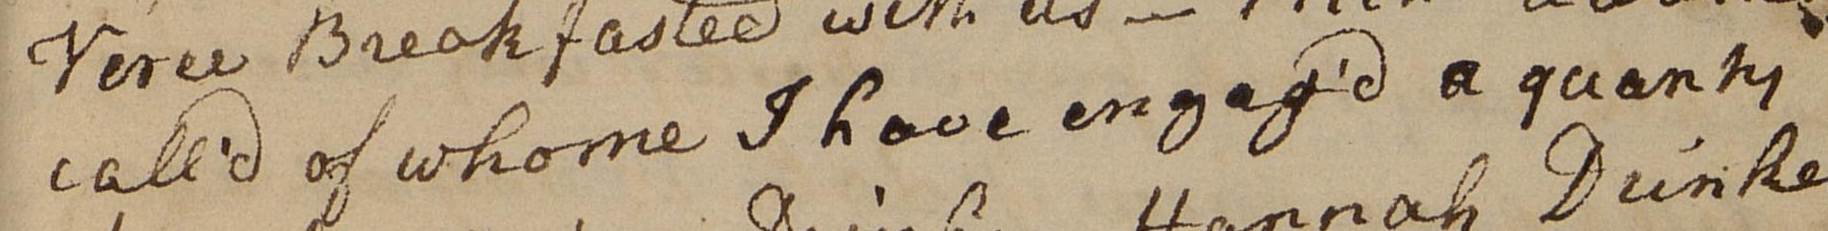call'd of whome I have engag'd a quanty
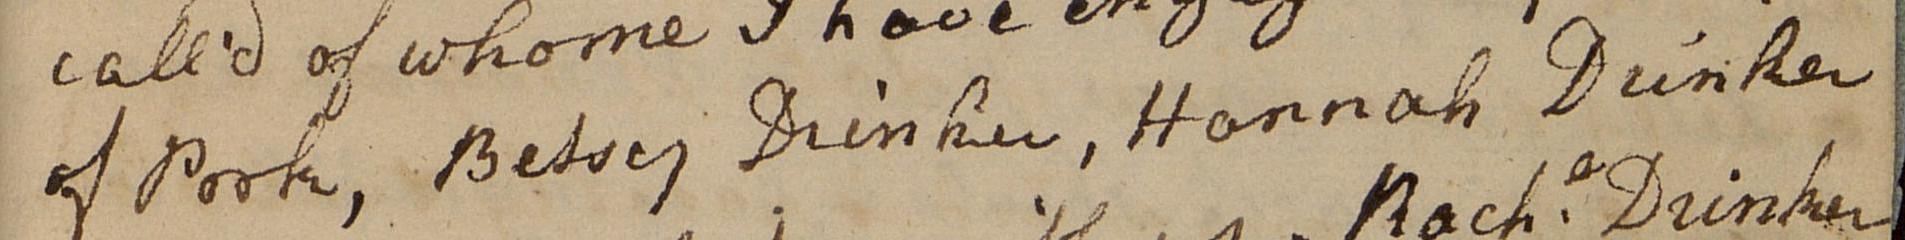of Pork, Betsey Drinker, Hannah Drinker
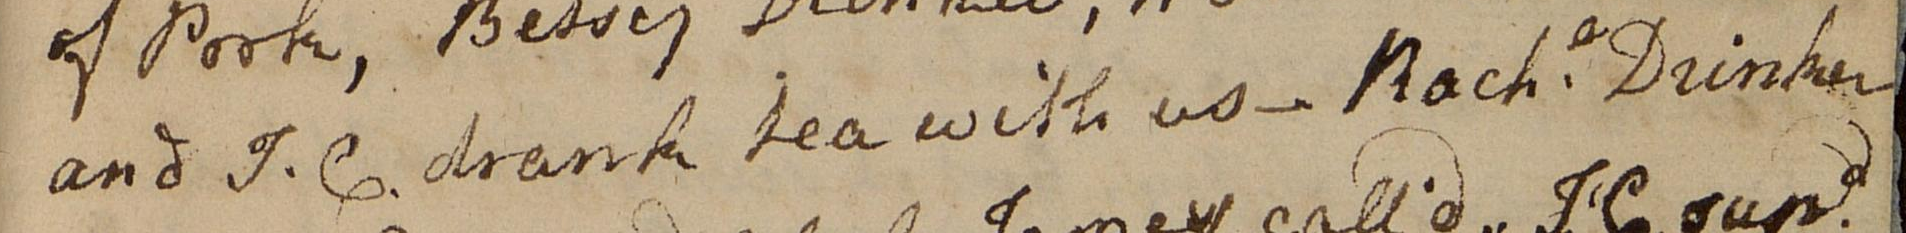and I. C. drank tea with us- Rach^l. Drinker
